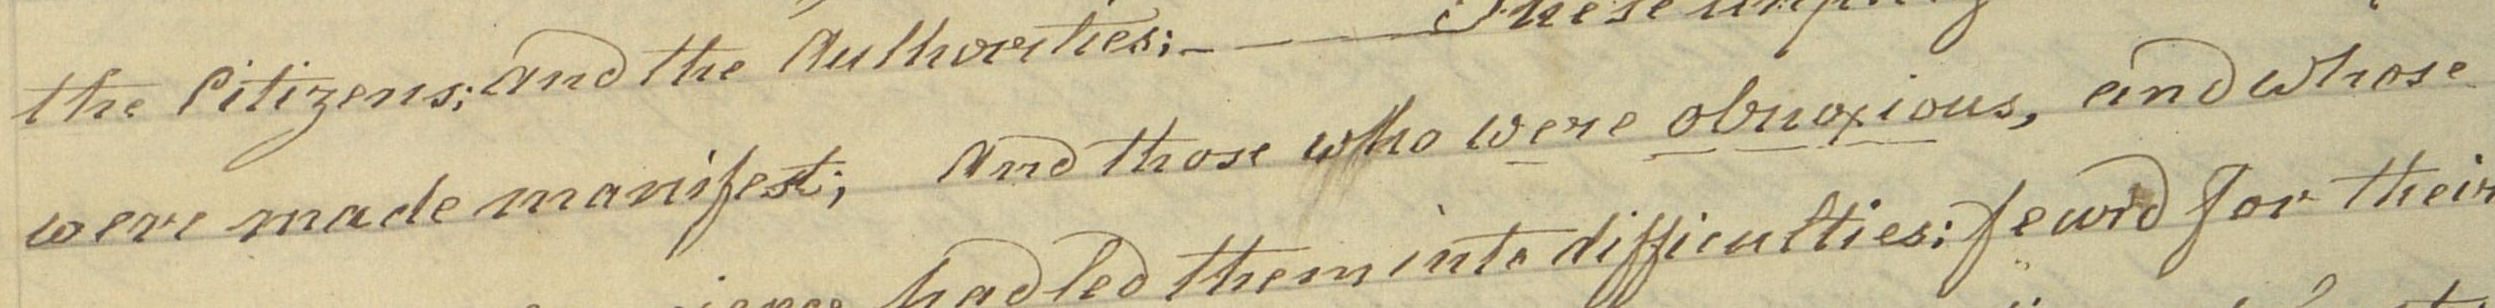were made manifest; and those who were obnoxious, and whose
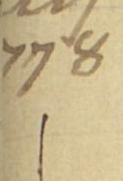-778
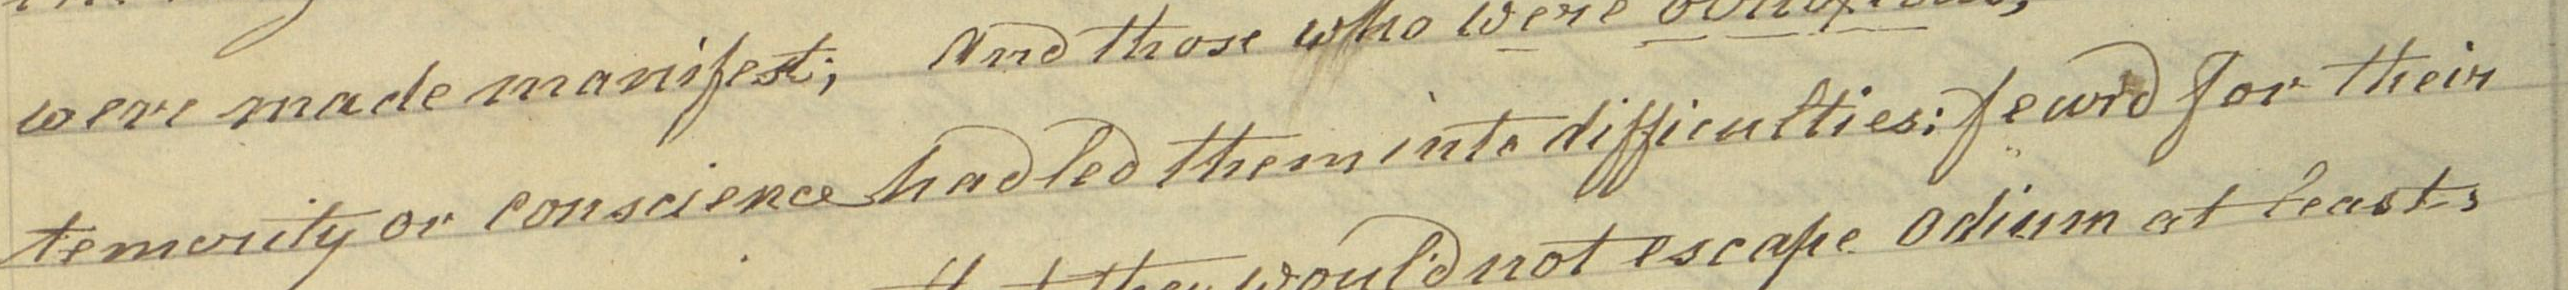temerity or conscience had led them into difficulties: fear'd for their
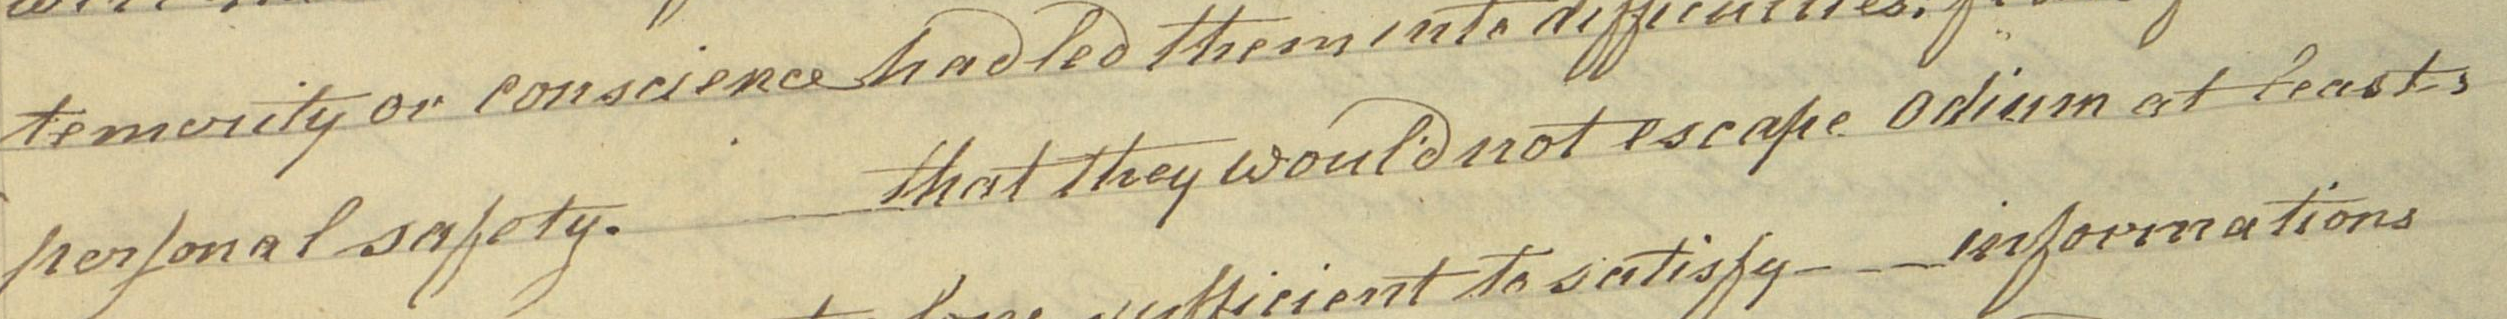personal safety. That they would not escape Odium at least.
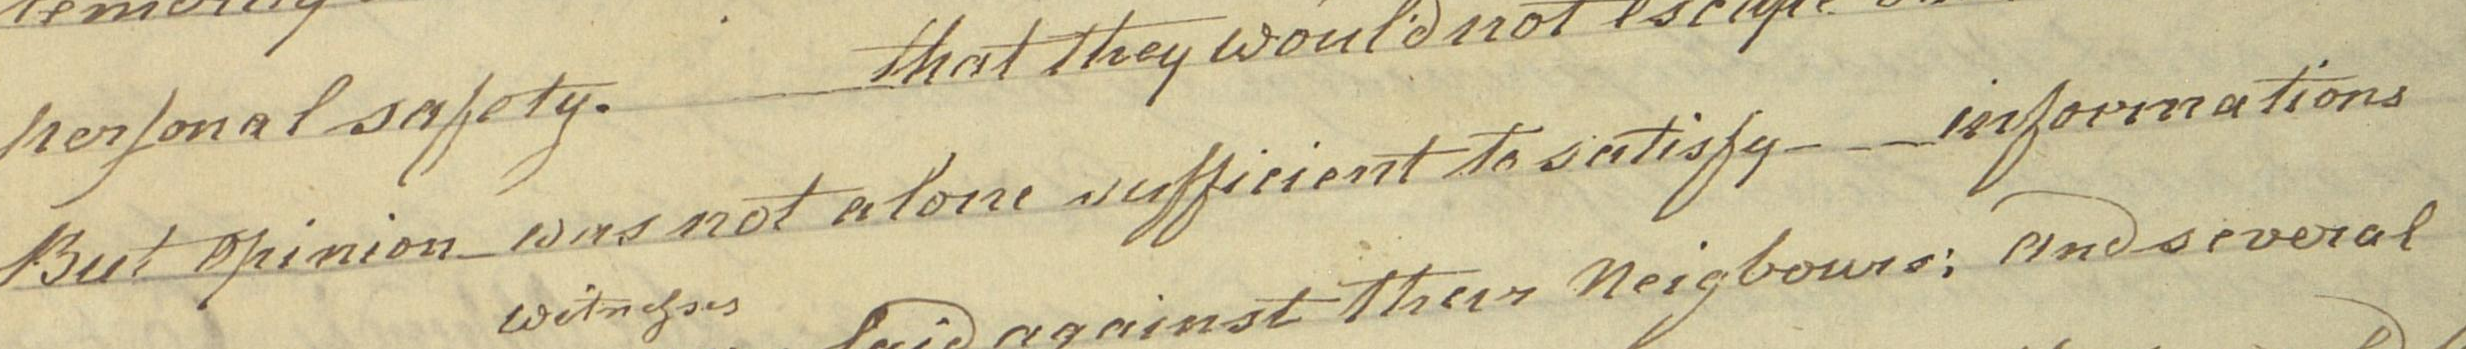But Opinion was not alone sufficient to satisfy- informations
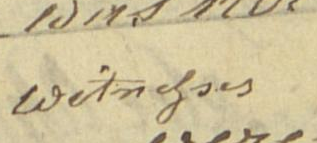witnesses
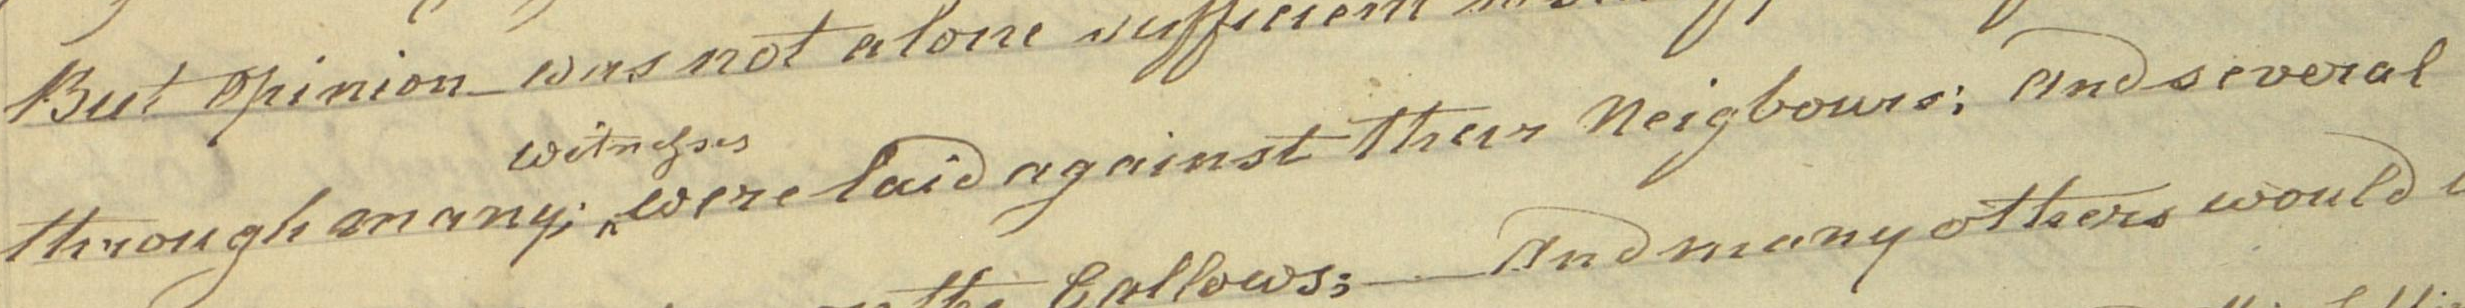through many ^ were laid against their Neigbours: and several
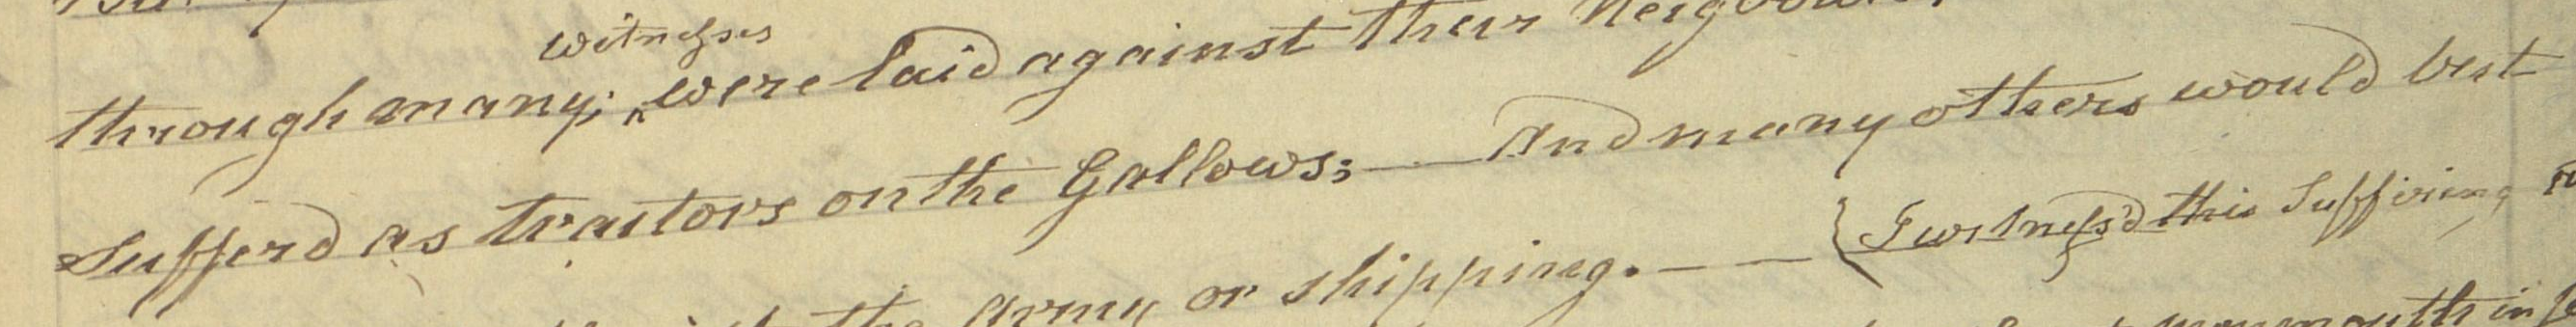suffered as traitors on the Gallows.- And many others would best
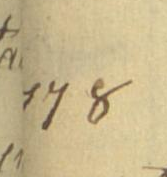-778
